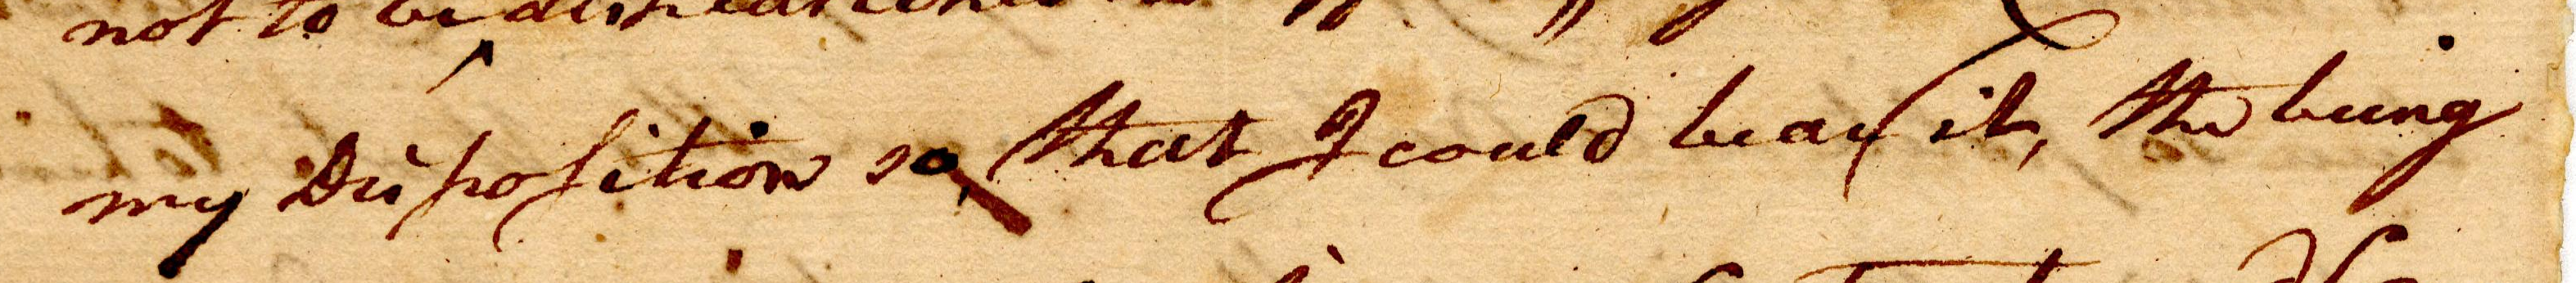my Disposition so, that I could be as if, the being
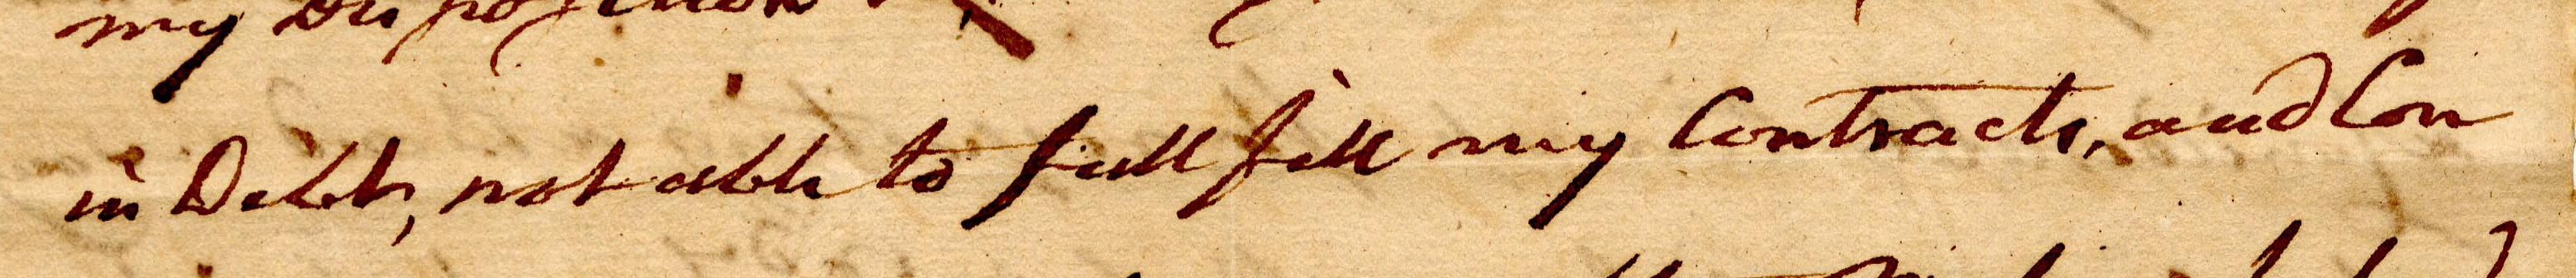in Debt, not able to fullfill my Contracts, and con-
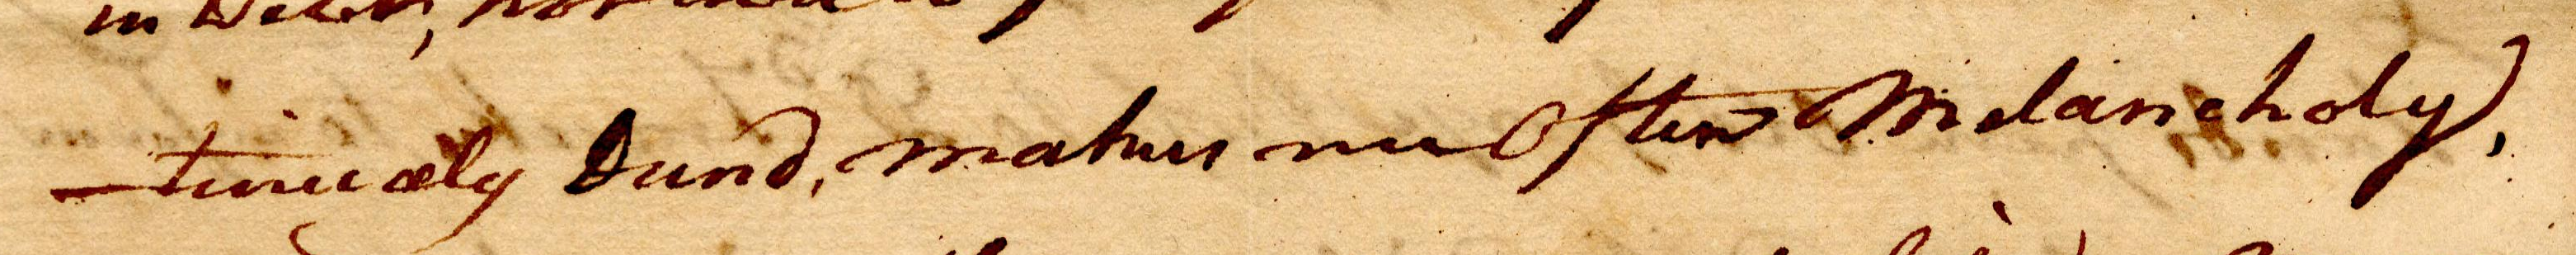-tinually Dund makes more often Melancholy,
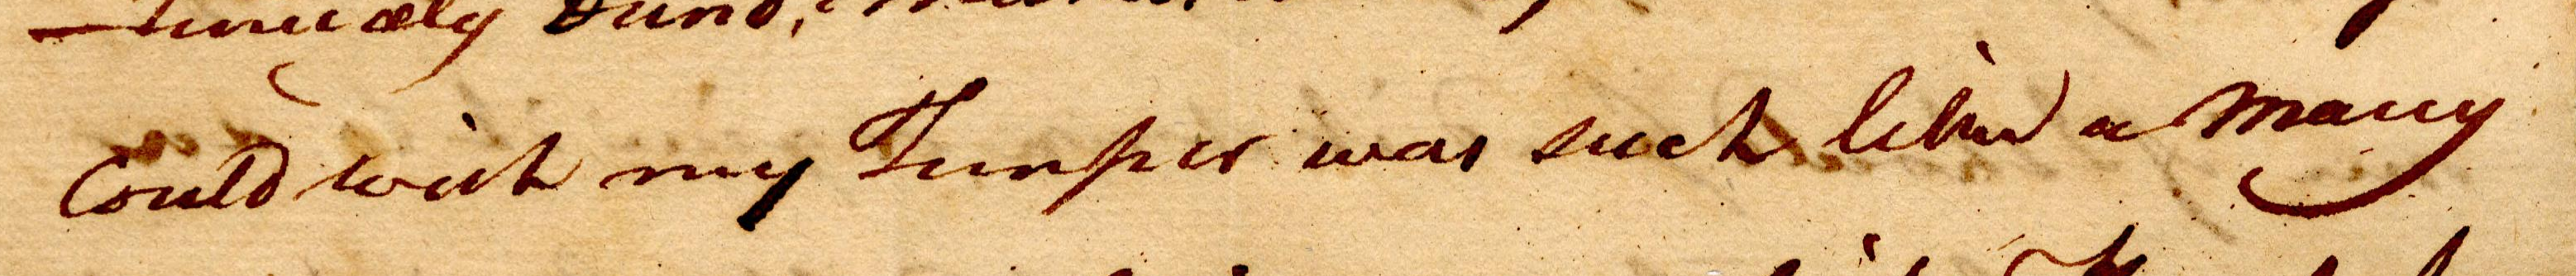Could with my Temper was such liked a many
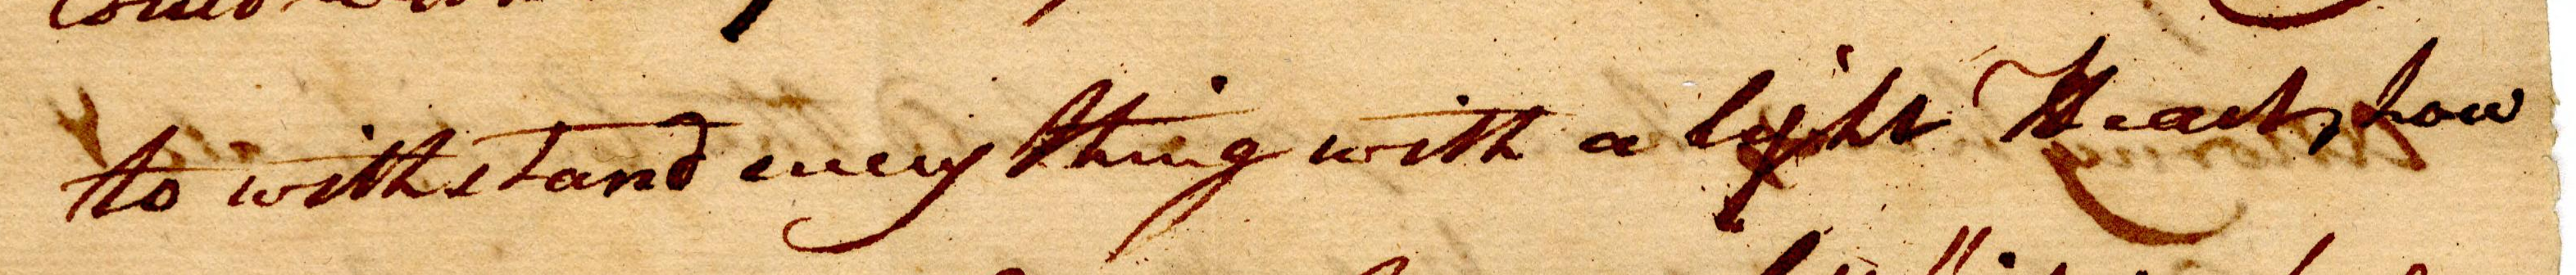to withstand every thing with a light Heart how
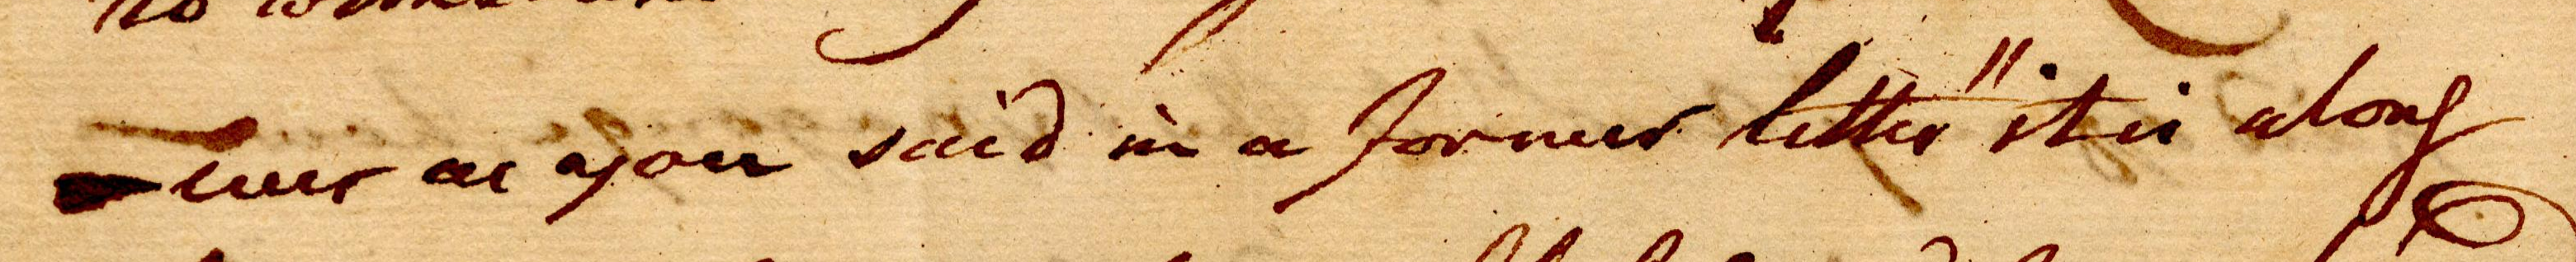-ever as you said in a former letter "it is along
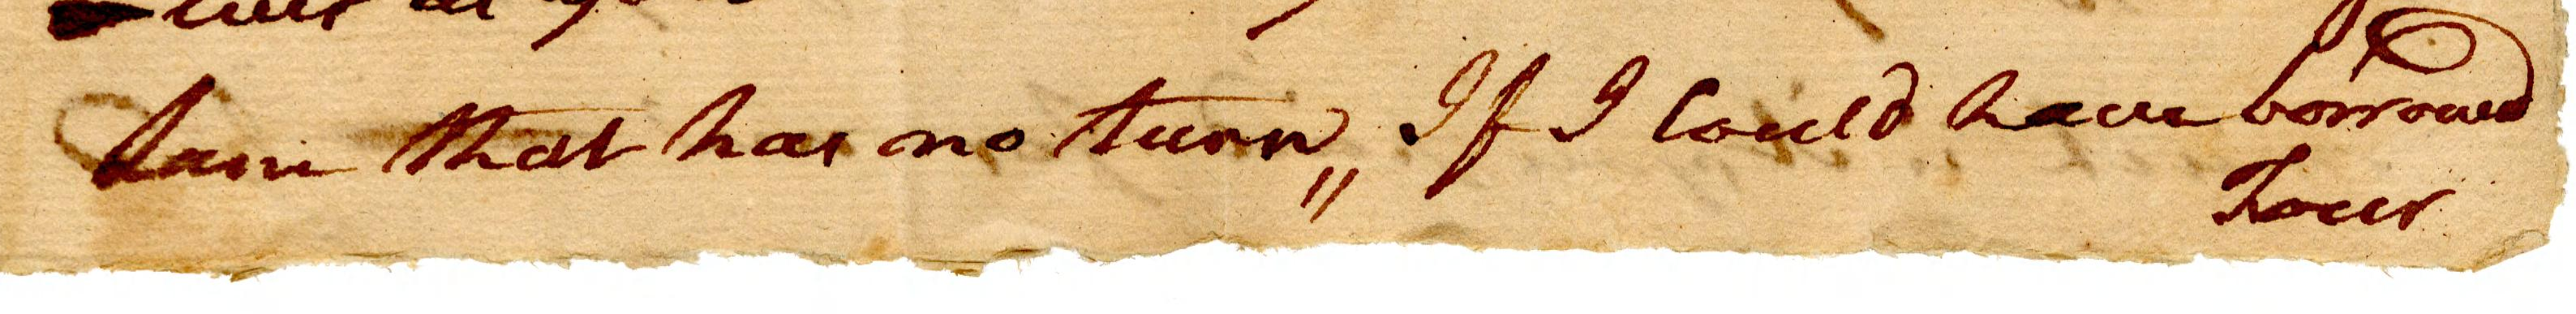time that has no turn" If I could have borrowd
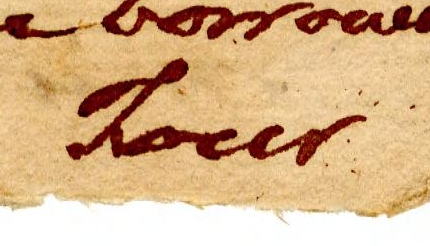Four
